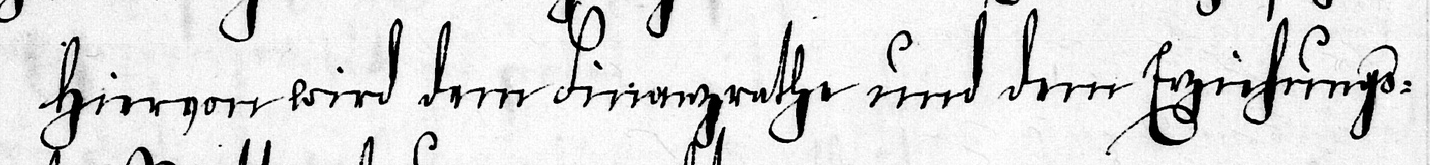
Hiervon wird dem Finanzrathe und dem Erziehungs¬
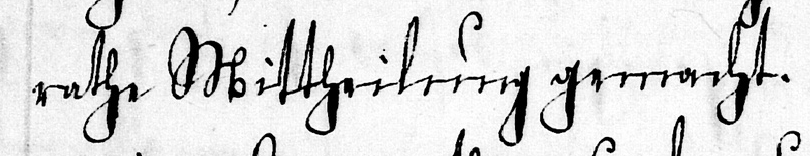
rathe Mittheilung gemacht.
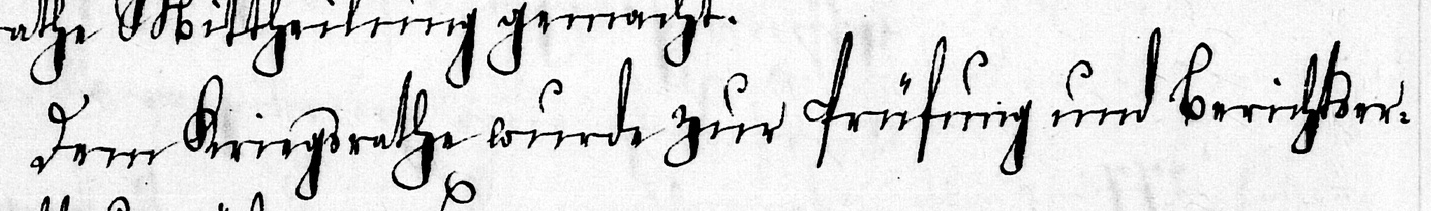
Dem Kriegsrathe wurde zur Prüfung und Berichtser¬
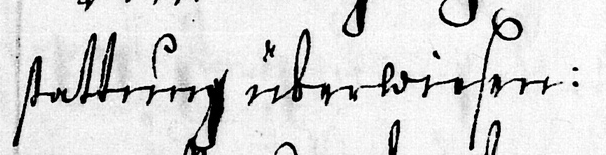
stattung überwiesen:
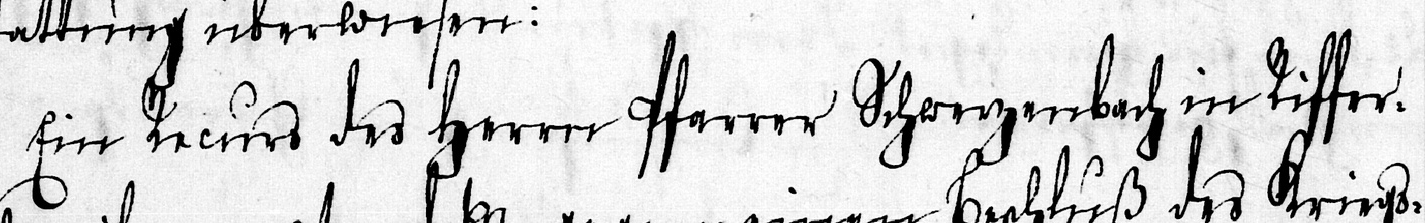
Ein Recurs des Herrn Pfarrer Schwerzenbach in Riffer¬
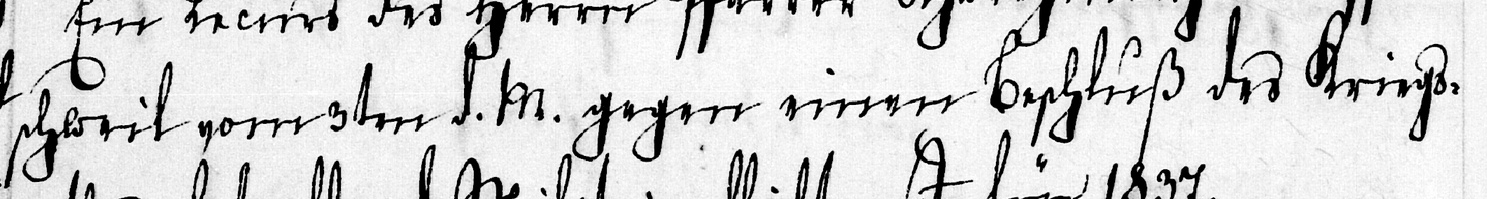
schweil vom 3ten d. M. gegen einen Beschluß des Kriegs¬
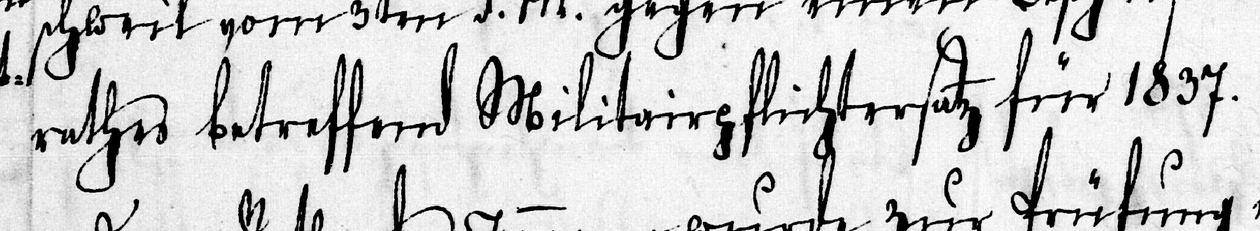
rathes betreffend Militairpflichtersatz für 1837.
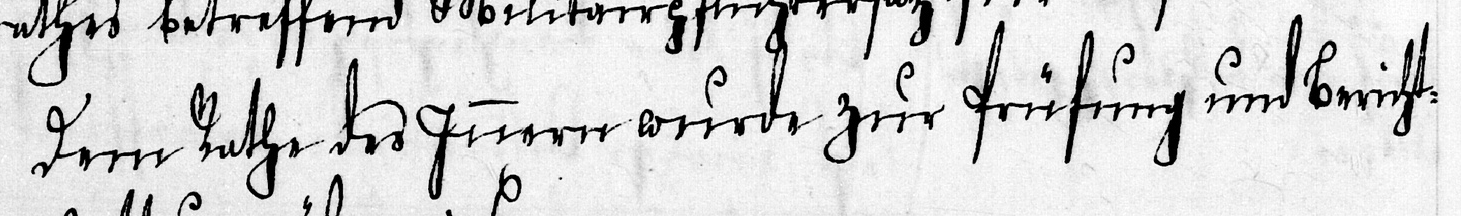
Dem Rathe des Innern wurde zur Prüfung und Berich¬
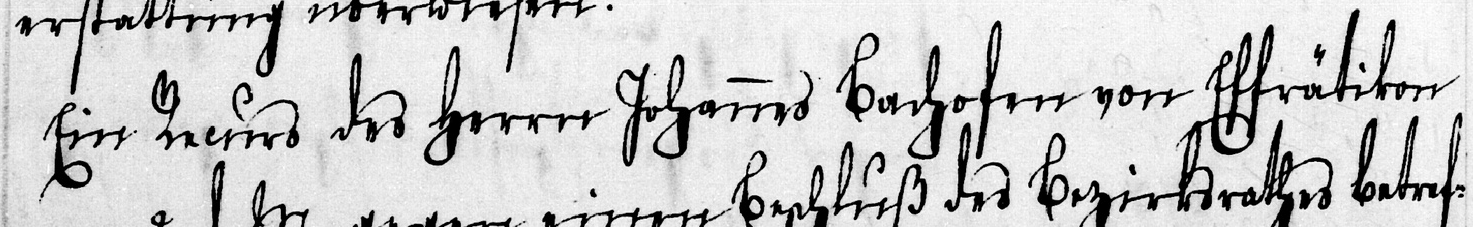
Ein Recurs des Herrn Johannes Bachofen von Effrätikon
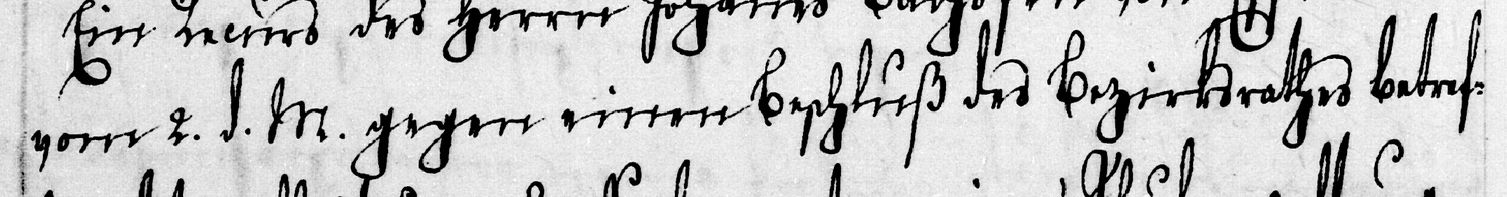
vom 2. d. M. gegen einen Beschluß des Bezirksrathes betref¬
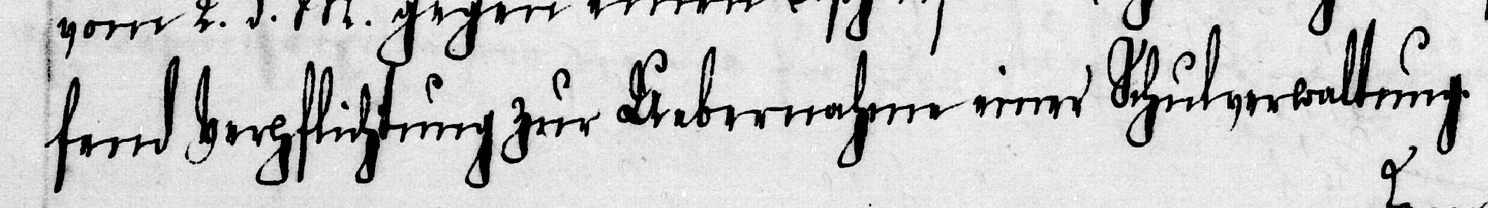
fend Verpflichtung zur Uebernahme einer Schulverwaltung.
